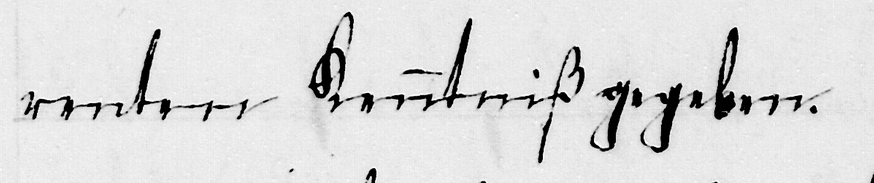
renten Kenntniß gegeben.
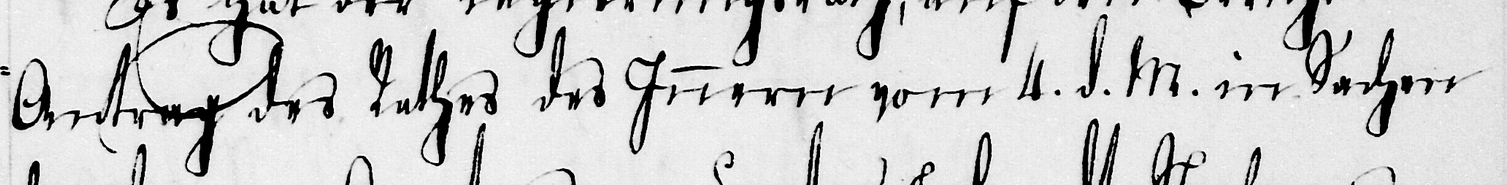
Antrag des Rathes des Innern vom 4. d. M. in Sachen
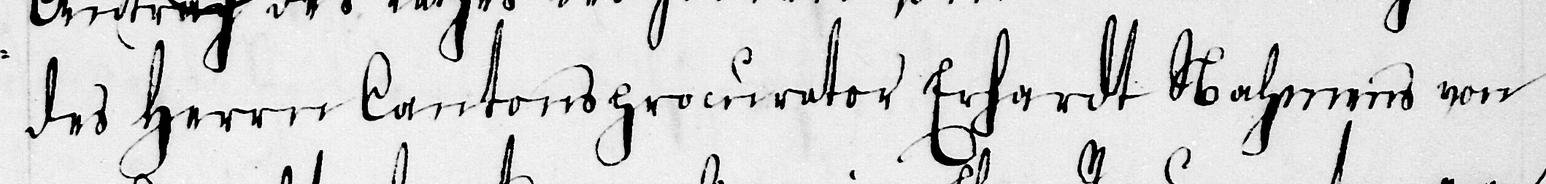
des Herrn Cantonsprocurator Erhardt Nahmens von
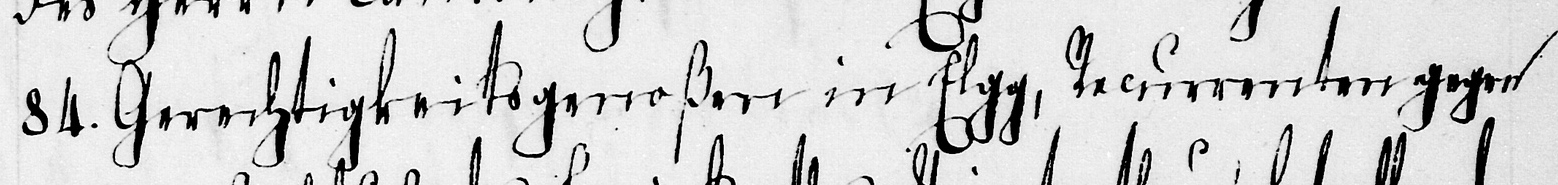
84. Gerechtigkeitsgenoßen in Elgg, Recurrenten gegen
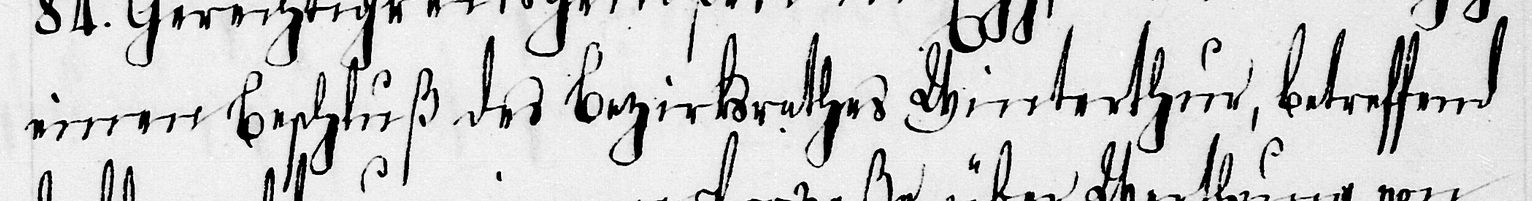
einen Beschluß des Bezirksrathes Winterthur, betreffend
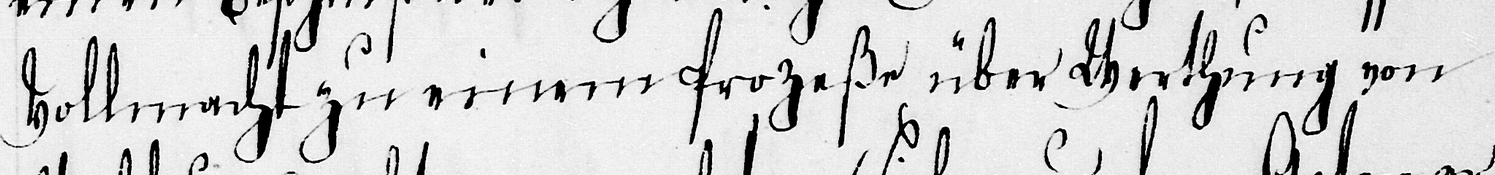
Vollmacht zu einem Prozeße über Werthung von
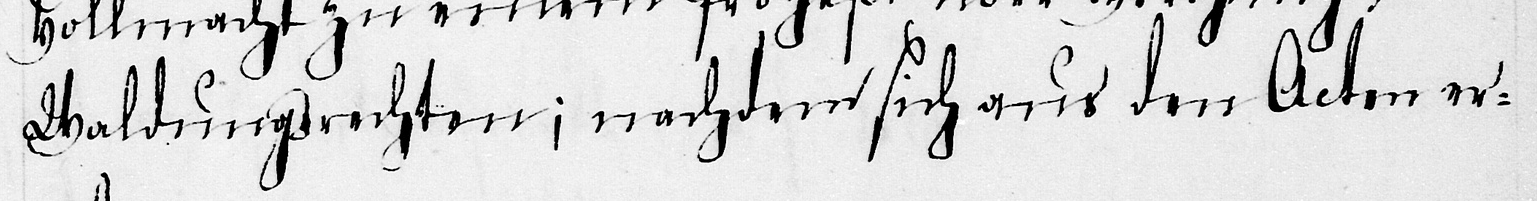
Waldungsrechten; nachdem sich aus den Acten er¬
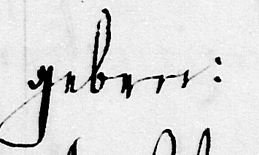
geben:
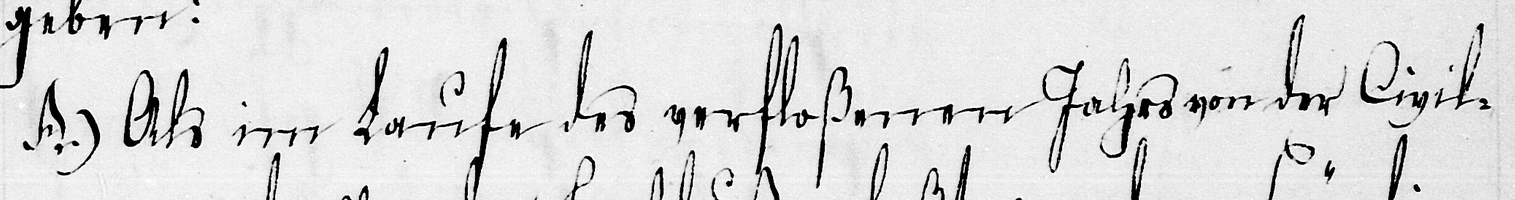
A.) Als im Laufe des verfloßenen Jahres von der Civil¬
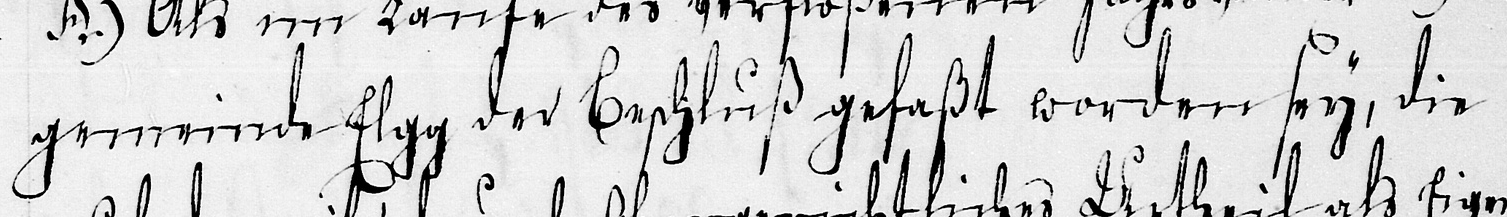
gemeinde Elgg der Beschluß gefaßt worden sey, die
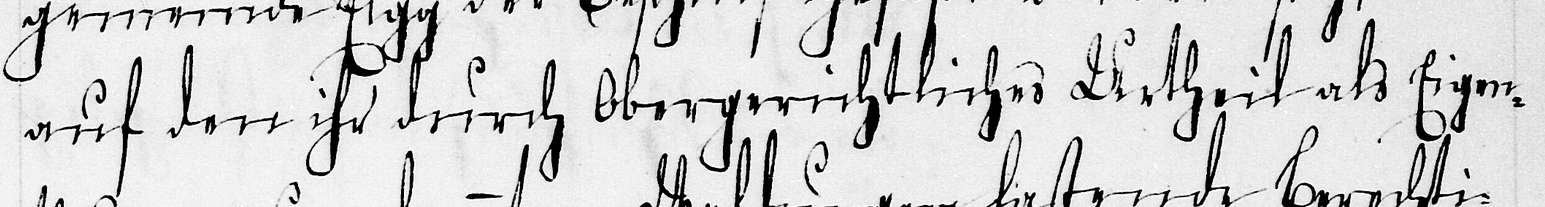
auf den ihr durch Obergerichtliches Urtheil als Eigen¬
